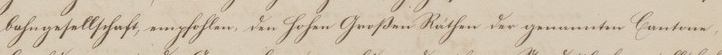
bahngesellschaft, empfohlen, den hohen Großen Räthen der genannten Cantone,
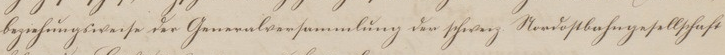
beziehungsweise der Generalversammlung der schweiz. Nordostbahngesellschaft
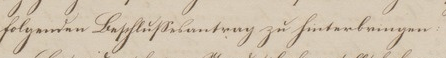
folgenden Beschlußesantrag zu hinterbringen:
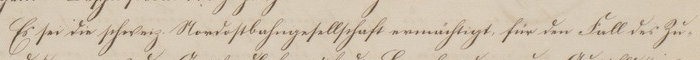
«Es sei die schweiz. Nordostbahngesellschaft ermächtigt, für den Fall des Zu-
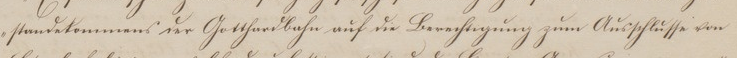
standekommens der Gotthardbahn auf die Berechtigung zum Ausschlusse von
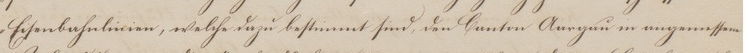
Eisenbahnlinien, welche dazu bestimmt sind, den Canton Aargau in angemessene
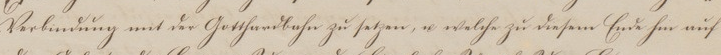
Verbindung mit der Gotthardbahn zu setzen, & welche zu diesem Ende hin auf
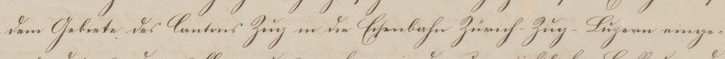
dem Gebiete des Cantons Zug in die Eisenbahn Zürich–Zug–Luzern einge-
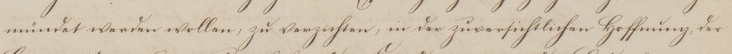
mündet werden wollen, zu verzichten, in der zuversichtlichen Hoffnung, der
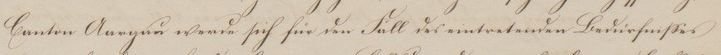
Canton Aargau werde sich für den Fall des eintretenden Bedürfnißes
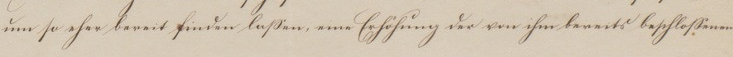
um so eher bereit finden laßen, eine Erhöhung der von ihm bereits beschloßenen
